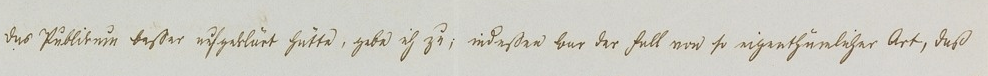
das Publikum beßer aufgeklärt hätte, gebe ich zu; indeßen war der Fall von so eigenthümlicher Art, daß
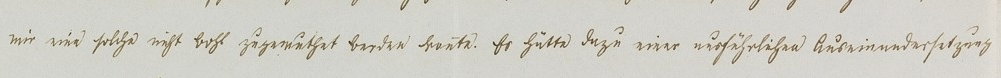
mir eine solche nicht wohl zugemuthet werden konnte. Es hätte dazu einer ausführlichen Auseinandersetzung
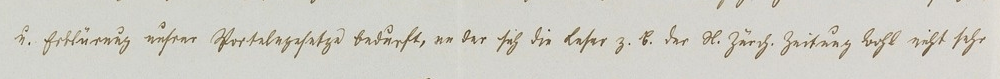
u. Erklärung unsrer Sportelngesetze bedurft, an der sich die Leser z. B. der N. Zürch. Zeitung wohl nicht sehr
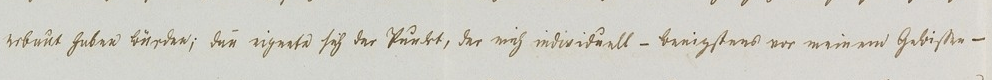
erbaut haben würden; dann eignete sich der Punkt, der mich individuell – wenigstens vor meinem Gewißen –
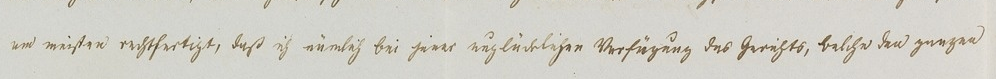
am meisten rechtfertigt, daß ich nämlich bei seiner unglücklichen Verfügung des Gerichts, welche den ganzen
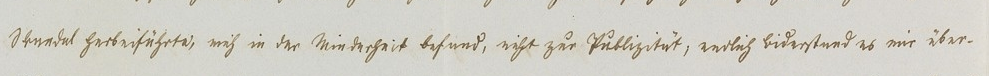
Skandal herbeiführte, mich in der Minderheit befand, nicht zur Publizität, endlich widerstand es mir über-
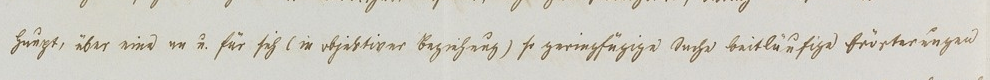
haupt, über eine an u. für sich (in objektiver Beziehung) so geringfügige Sache weitläufige Erörterungen
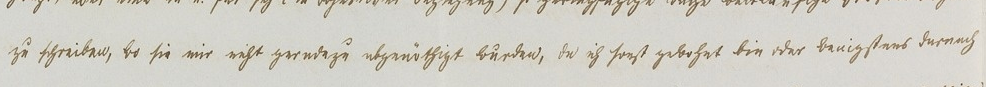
zu schreiben, wo sie mir nicht geradezu abgenöthigt wurden, da ich sonst gewohnt bin oder wenigstens darnach
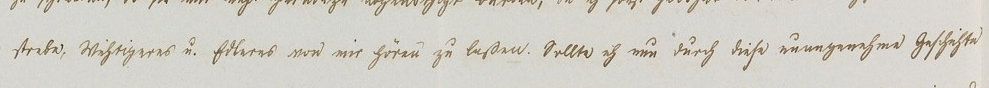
strebe, Wichtigeres u. Edleres von mir hören zu laßen. Sollte ich nun durch diese unangenehme Geschichte
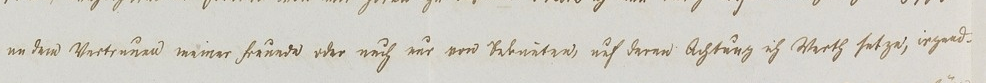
an dem Vertrauen meiner Freunde oder auch nur von Bekannten, auf deren Achtung ich Werth setze, irgend-
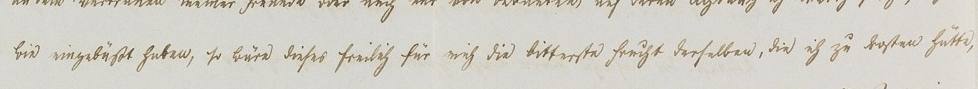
wie eingebüßt haben, so würde dieses freilich für mich die bitterste Frucht derselben, die ich zu kosten hätte,
